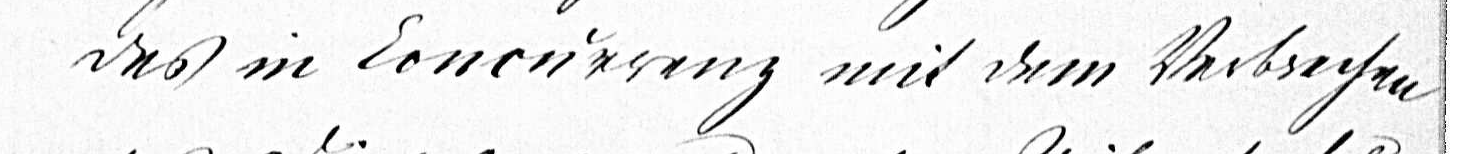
des in Concurrenz mit dem Verbrechen
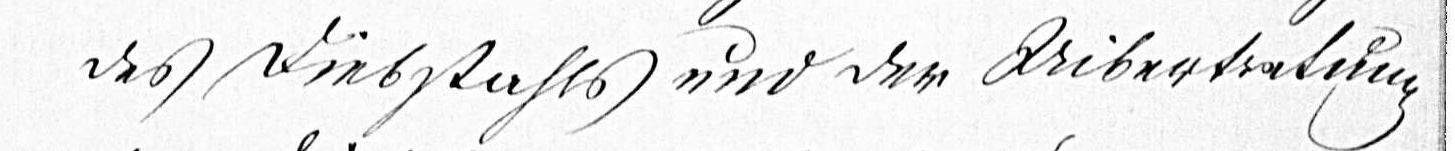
des Diebstahls und der Uibertretung
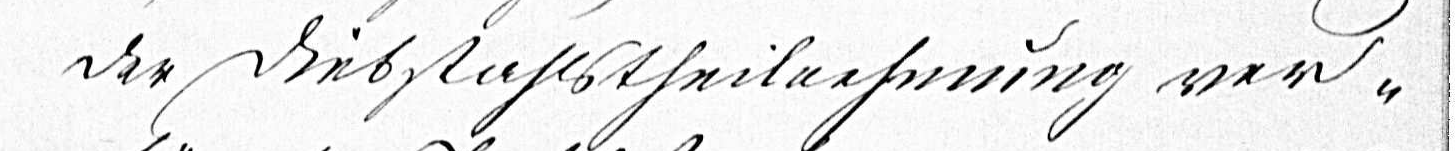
der Diebstahlstheilnehmung ver¬
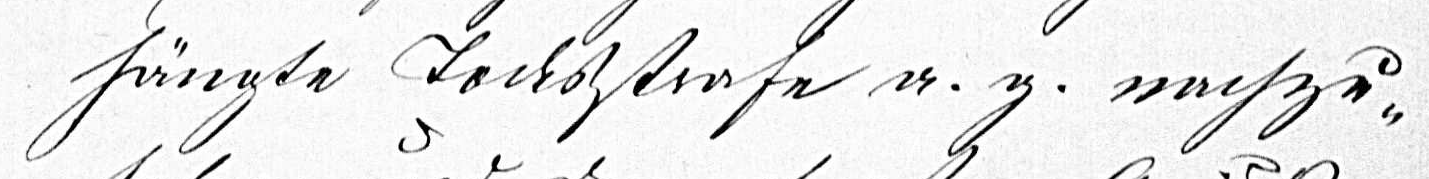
hängte Todesstrafe a.g. nachzu¬
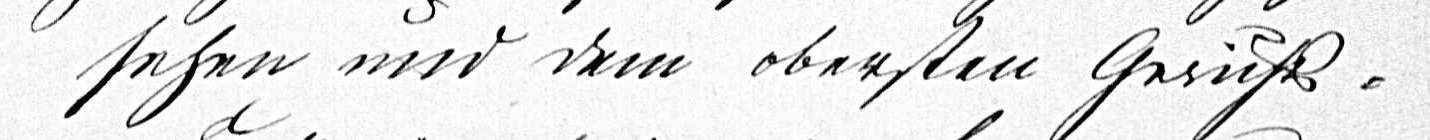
sehen und dem obersten Gerichts¬
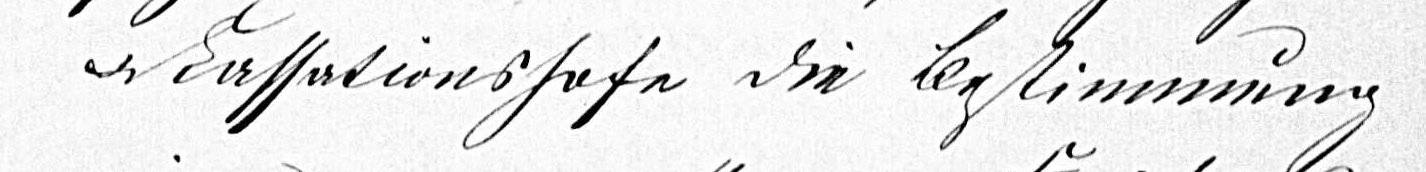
u. Cassationshofe die Bestimmung
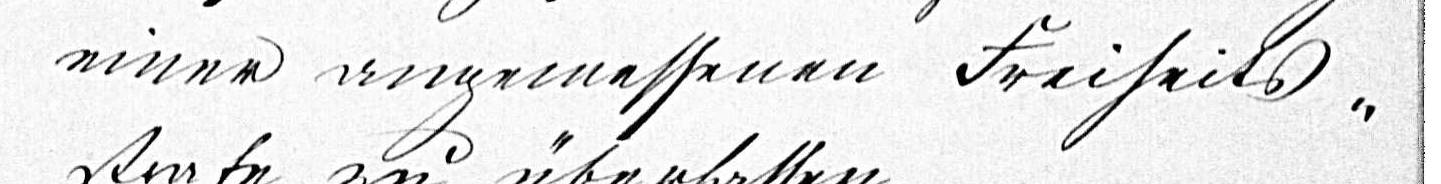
einer angemessenen Freiheits¬
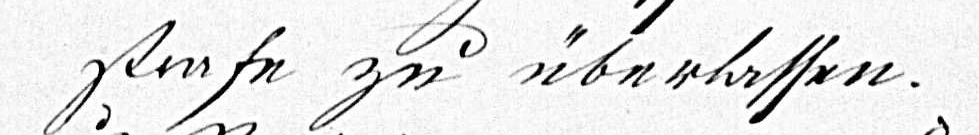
strafe zu überlassen.
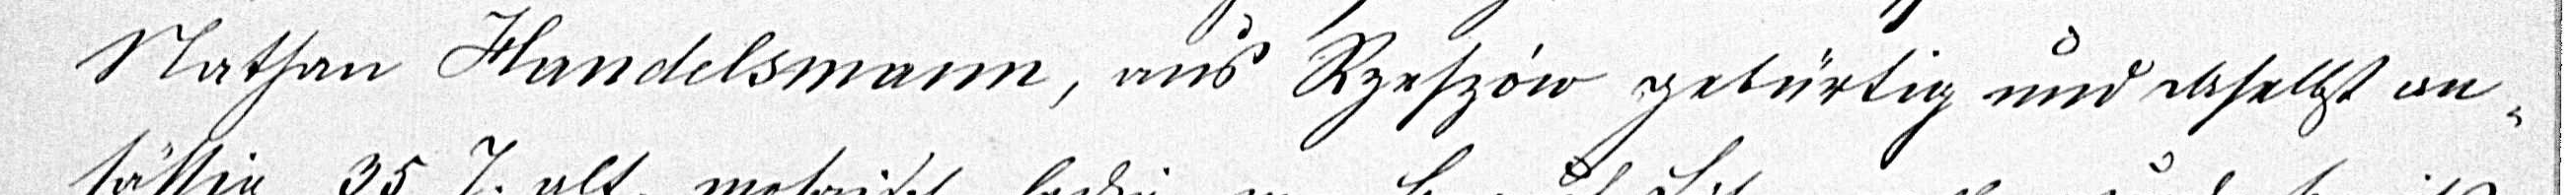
Nathan Handelsmann, aus Rzeszów gebürtig und daselbst an¬
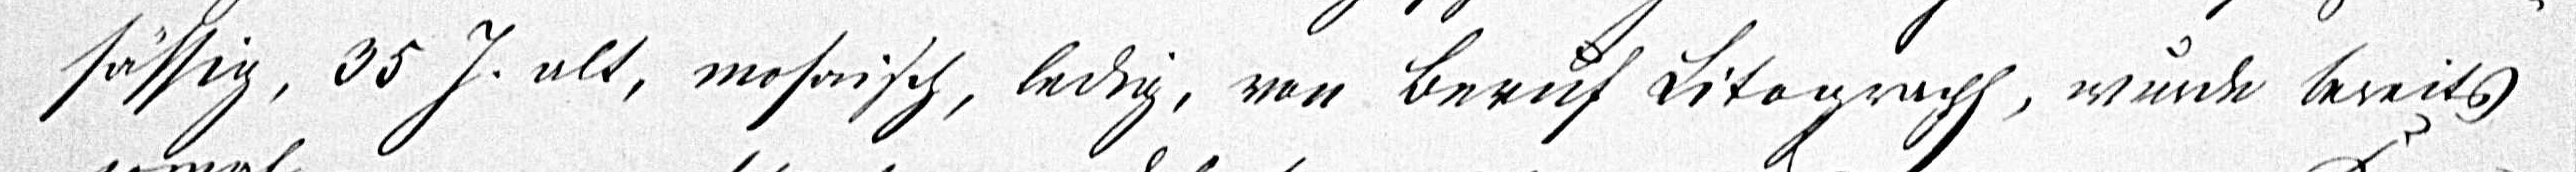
sässig, 35 J. alt, mosaisch, ledig, von Beruf Litograph, wurde bereits
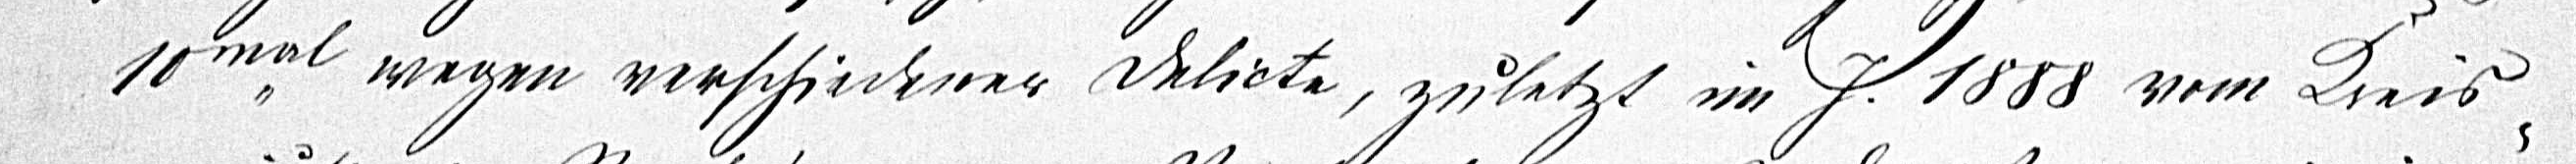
10mal wegen verschiedener Delicte, zuletzt im J. 1888 vom Kreis¬
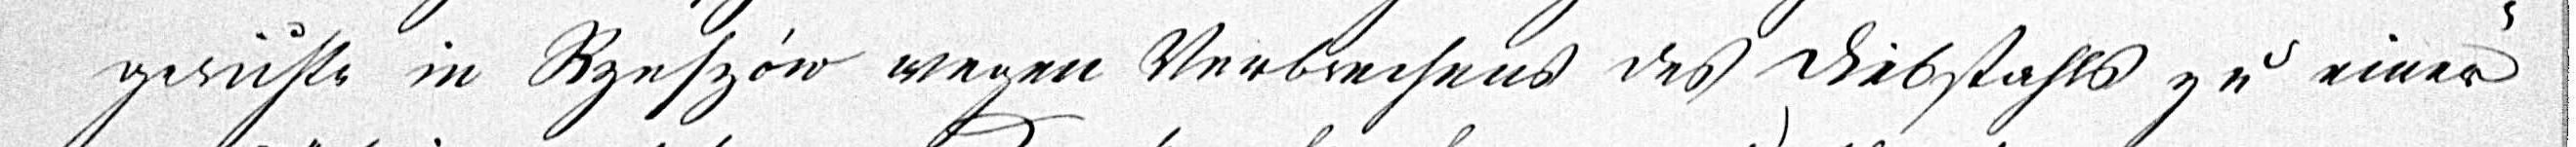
gerichte in Rzeszów wegen Verbrechens des Diebstahls zu einer
